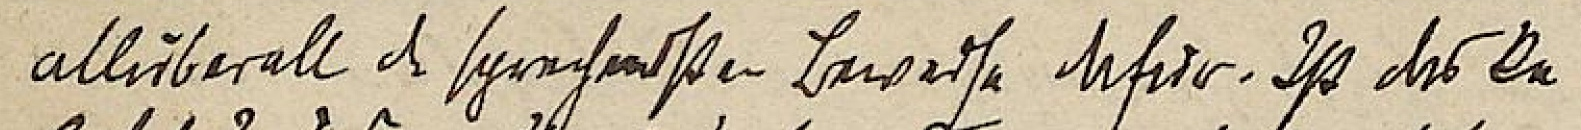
allüberall d. sprechendsten Beweise dafür. Ist das kn
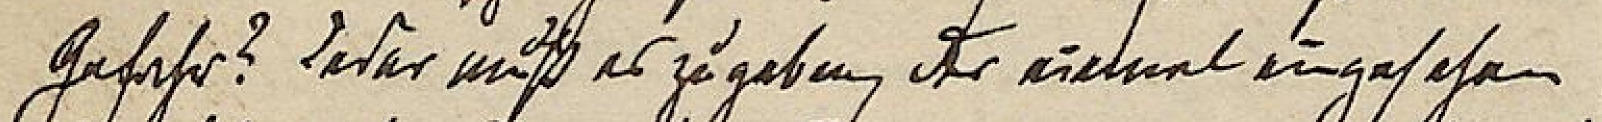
Gefahr? Jeder muß es zugeben, der einmal eingesehen
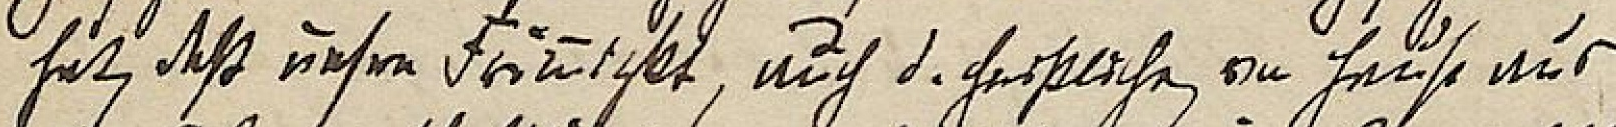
hat, daß unsre Frömigkeit, auch d. christliche, von Hause aus
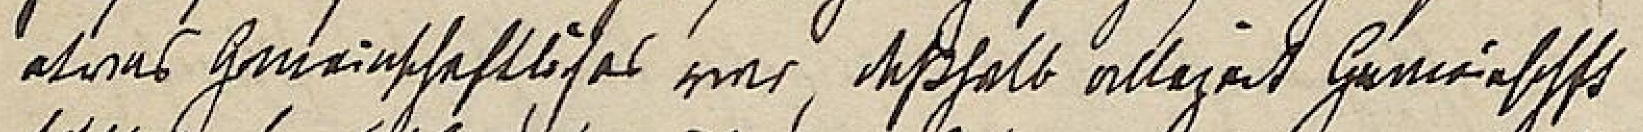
etwas Gemeinschaftliches war, deßhalb allezeit Gemeinschaft
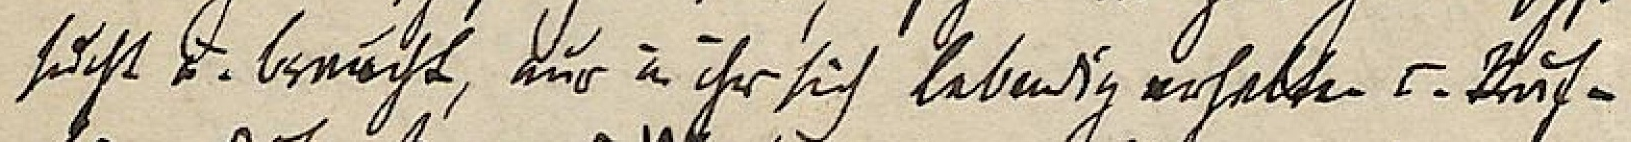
sucht u. braucht, nur in ihr sich lebendig erhalten u. kräf¬
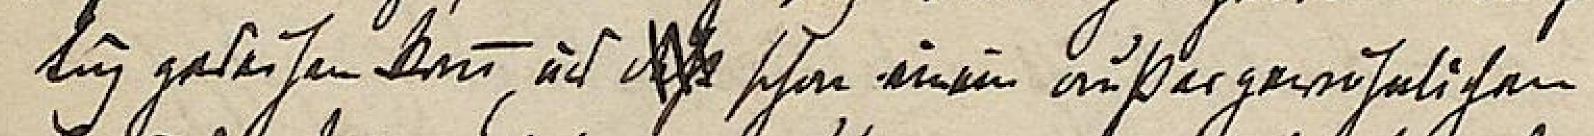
tig gedeihen kan, und daß schon einen außergewöhnlichen
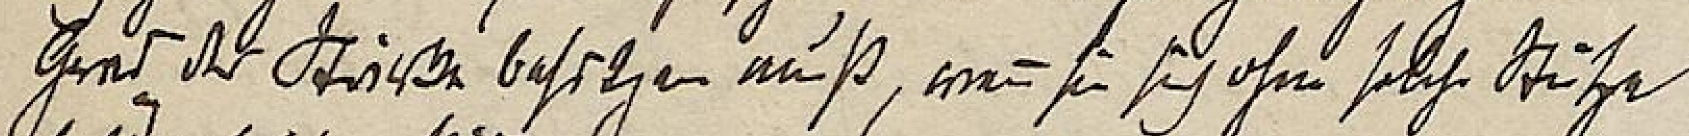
Grad der Stärke besitzen muß, wen sie sich ohne solche Stütze
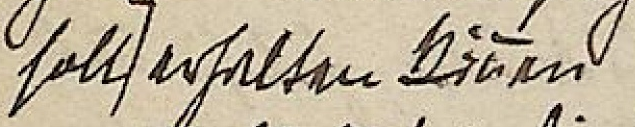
soll ] erhalten könen.
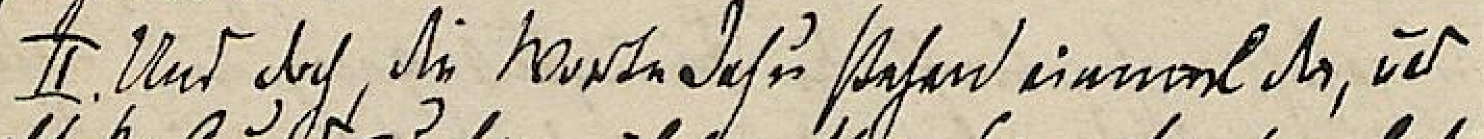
II. Und doch, die Worte Jesu stehen einmal da, und
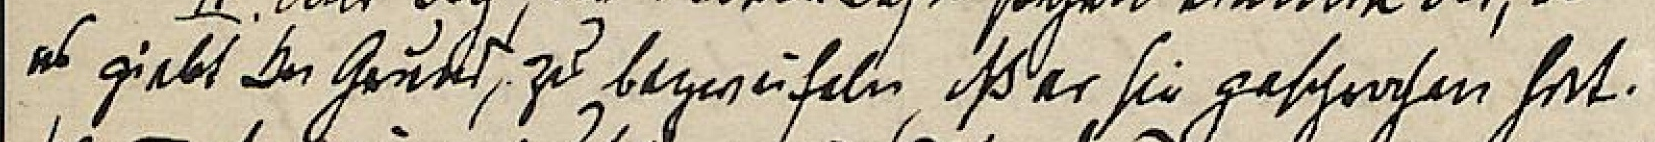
es giebt kn Grund, zu bezweifeln, dß er sie gesprochen hat.
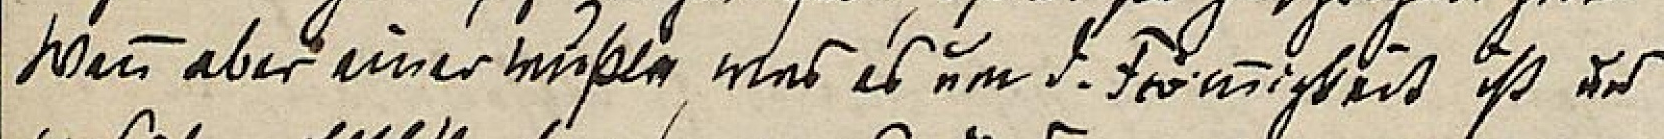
Wen aber einer wußte, was es um d. Frömigkeit ist, und
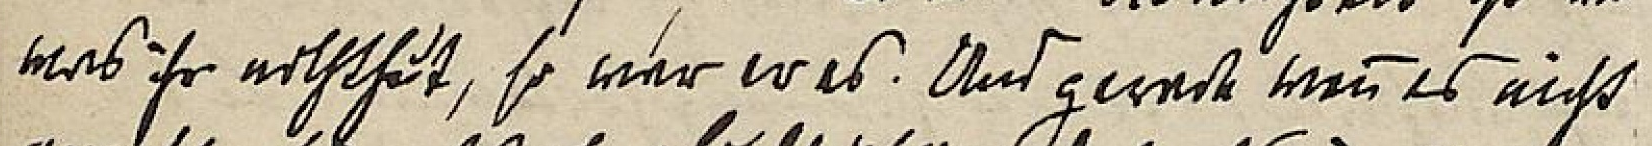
was ihr noththut, so war er es. Und gerade wen es nicht
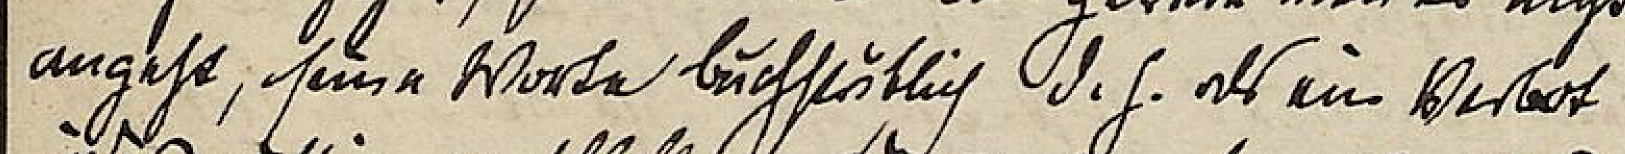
angeht, seine Worte buchstäblich d.h. als ein Verbot
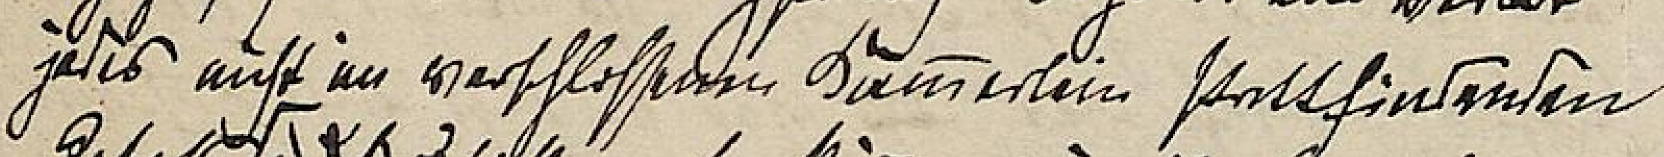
jedes nicht im verschlossenen Kämerlein stattfindenden
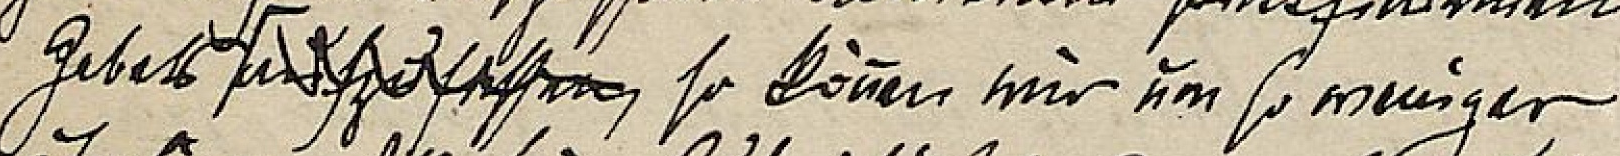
Gebets [ aufzusetzen so könen wir um so weniger
